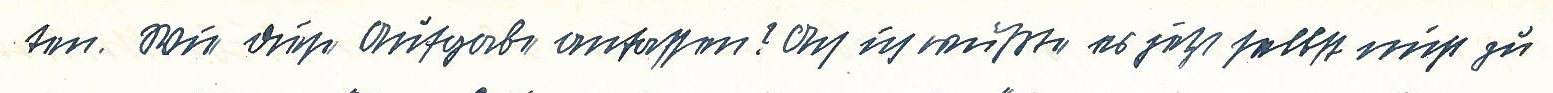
ten. Wie diese Aufgabe anfassen? Ach ich wüßte es jetzt selbst nicht zu
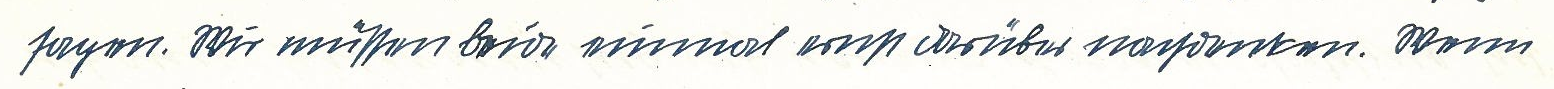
sagen. Wir müssen beide einmal ernst darüber nachdenken. Wenn
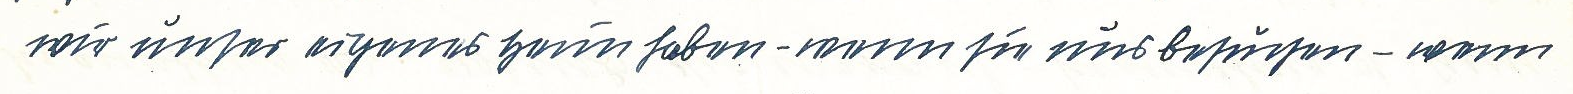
wir unser eigenes Heim haben – wenn sie uns besuchen – wenn
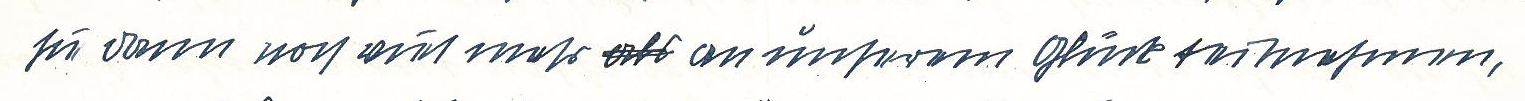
sie dann noch viel mehr als an unserem Glück teilnehmen,
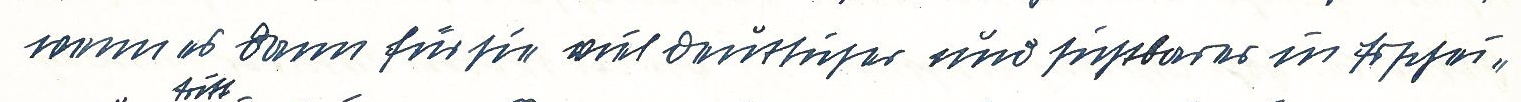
wenn es dann für sie viel deutlicher und sichtbarer in Erschei¬
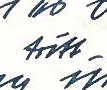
tritt
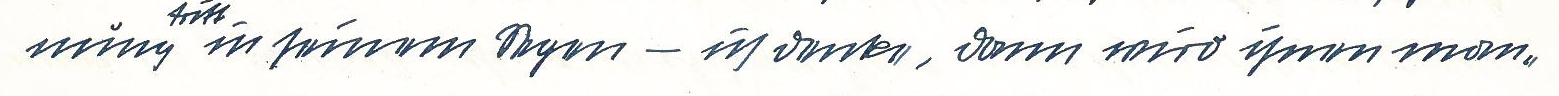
nung in seinem Segen – ich denke, dann wird ihnen man¬
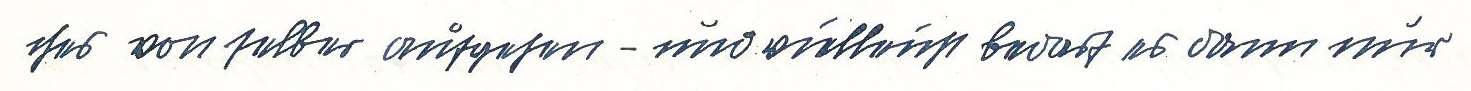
ches von selber aufgehen – und vielleicht bedarf es dann nur
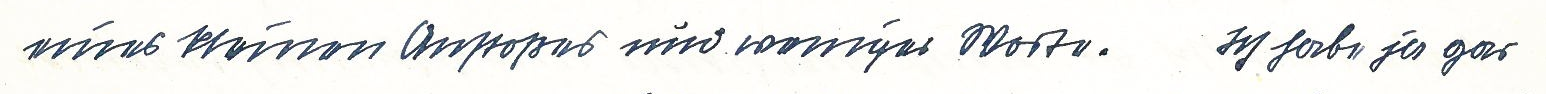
eines kleinen Anstoßes und weniger Worte. Ich habe ja gar
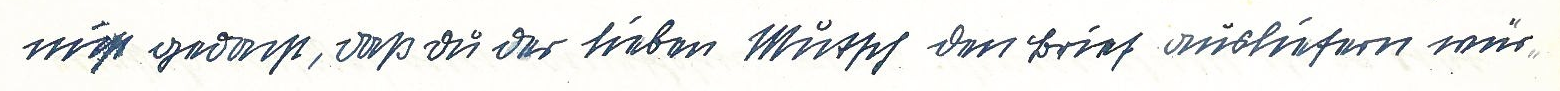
nicht gedacht, daß Du der lieben Mutsch den Brief ausliefern wür¬
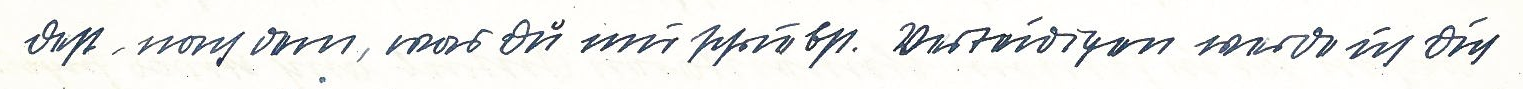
dest, nach dem, was Du mir schreibst. Verteidigen werde ich Dich
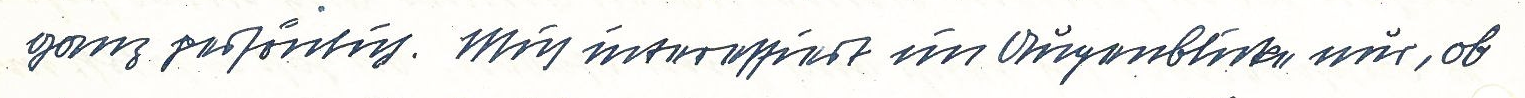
ganz persönlich. Mich interessiert im Augenblicke nur, ob
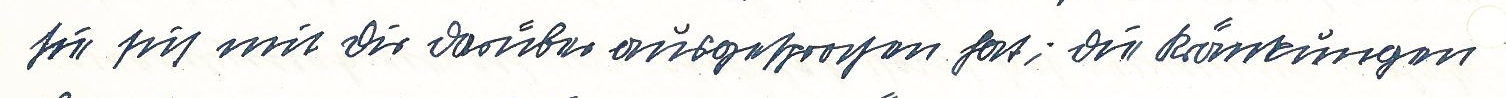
sie sich mit Dir darüber ausgesprochen hat; die Kränkungen
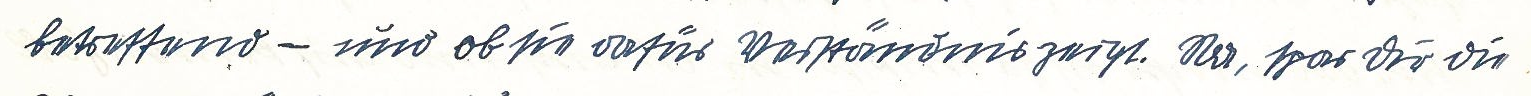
betreffend – und ob sie dafür Verständnis zeigt. Na, spar Dir die
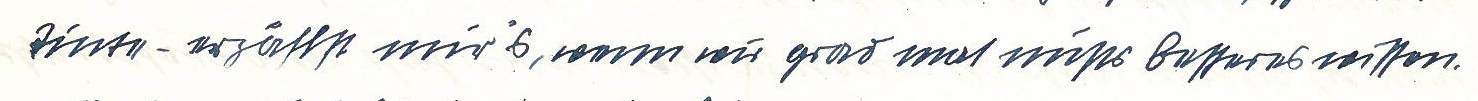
Tinte – erzählst mir’s, wenn wir grad mal nichts besseres wissen.
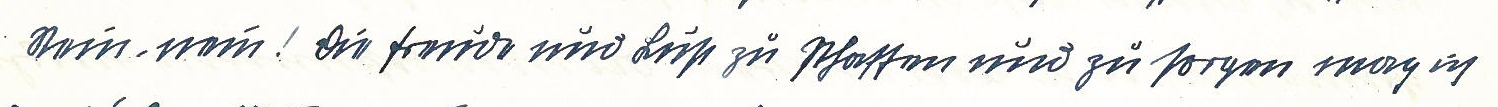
Nein, nein! Die Freude und Lust zu Schaffen und zu sorgen mag ich
